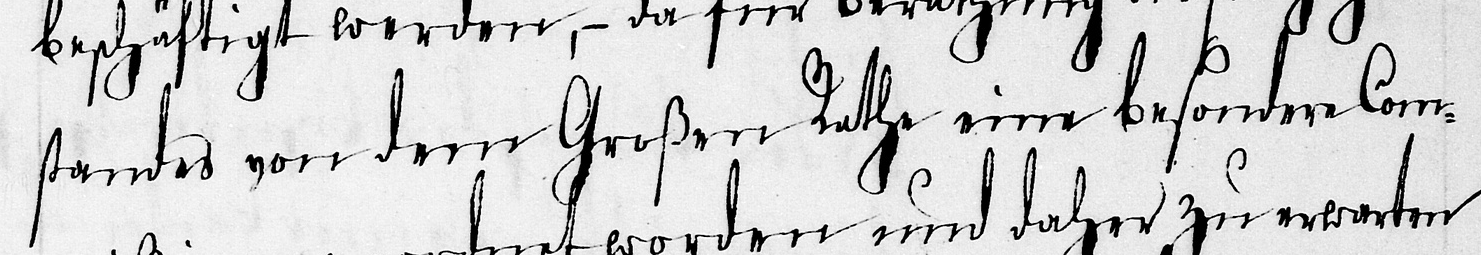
standes von dem Großen Rathe eine besondere Com¬
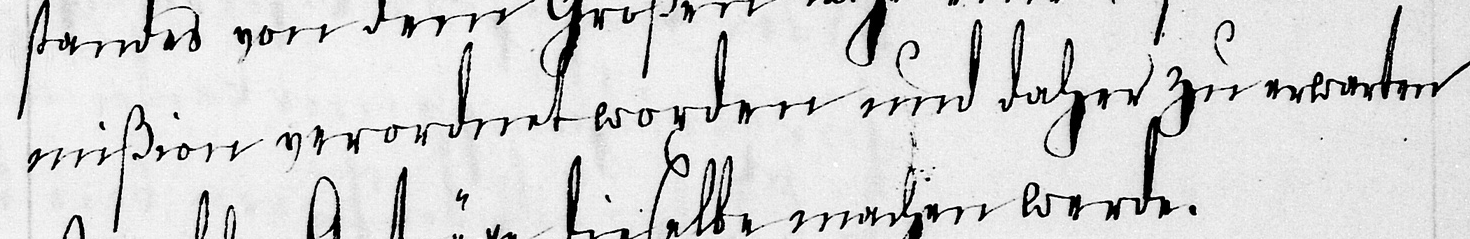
mißion verordnet worden und daher zu erwarten
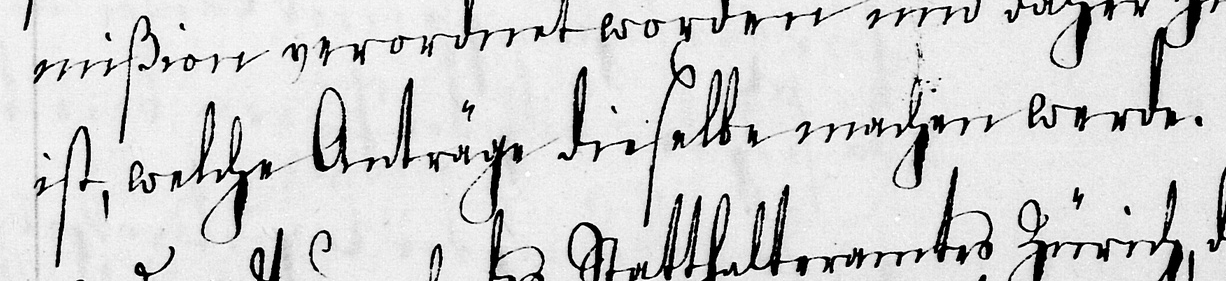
ist, welche Anträge dieselbe machen werde.
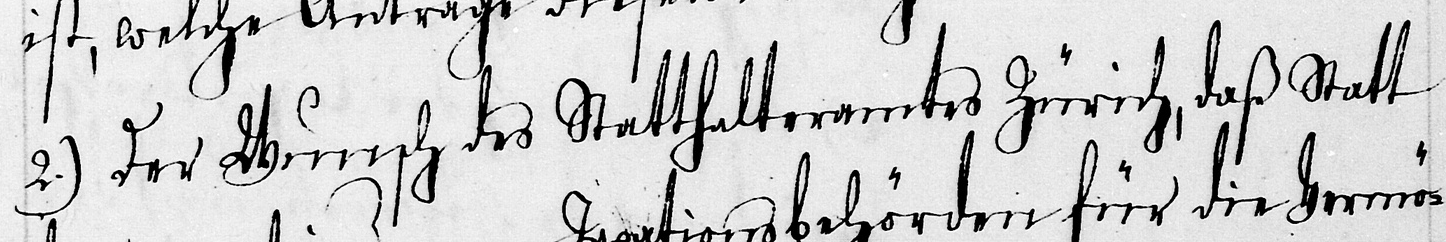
2.) Der Wunsch des Statthalteramtes Zürich, daß Statt
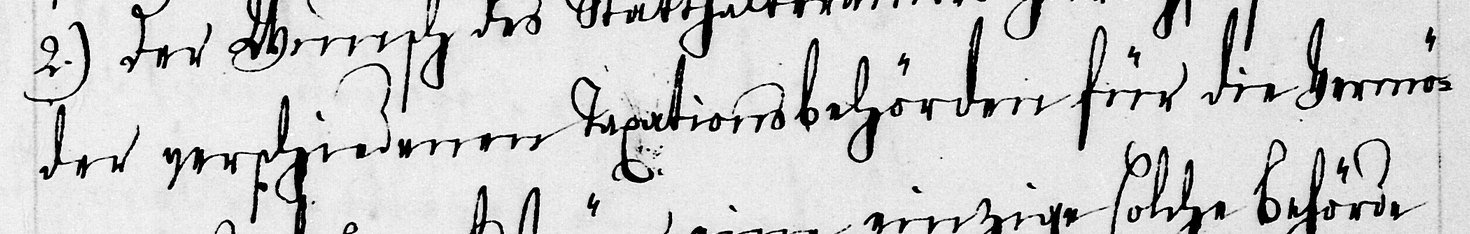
der verschiedenen Taxationsbehörden für die Vermö¬
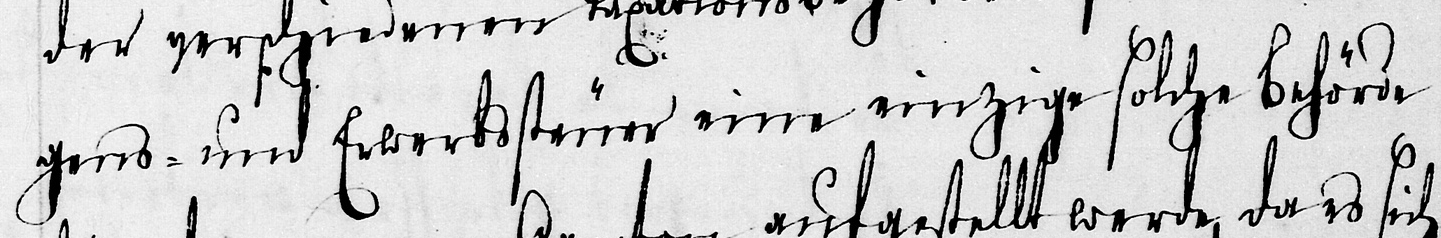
gens- und Erwerbssteuer eine einzige solche Behörde
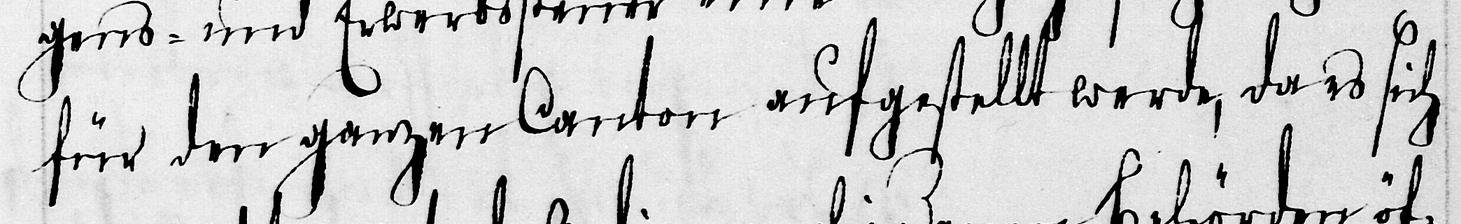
für den ganzen Canton aufgestellt werde, da es sich
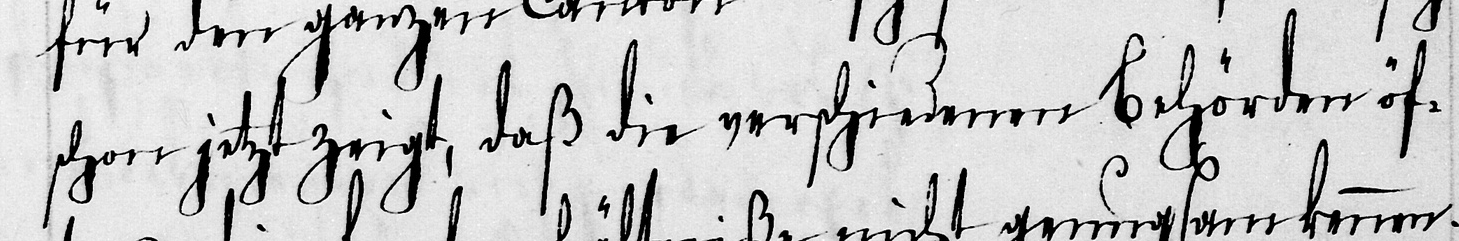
schon jetzt zeigt, daß die verschiedenen Behörden öf¬
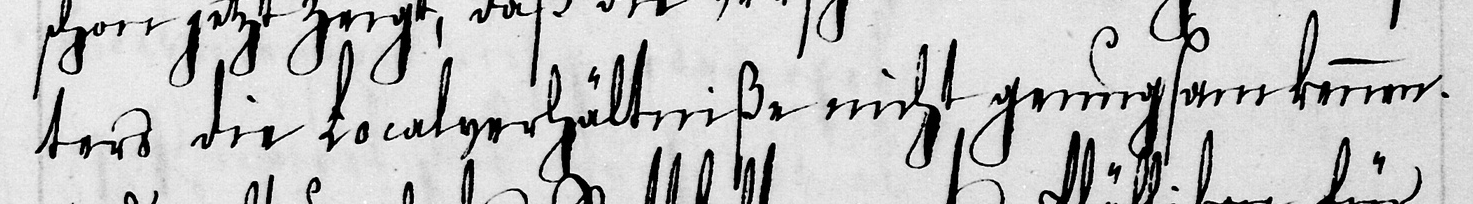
ters die Localverhältniße nicht genugsam kennen.
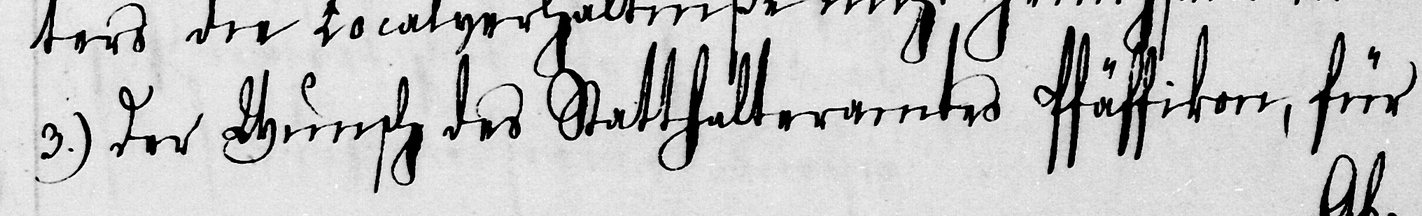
3.) Der Wunsch des Statthalteramtes Pfäffikon, für
